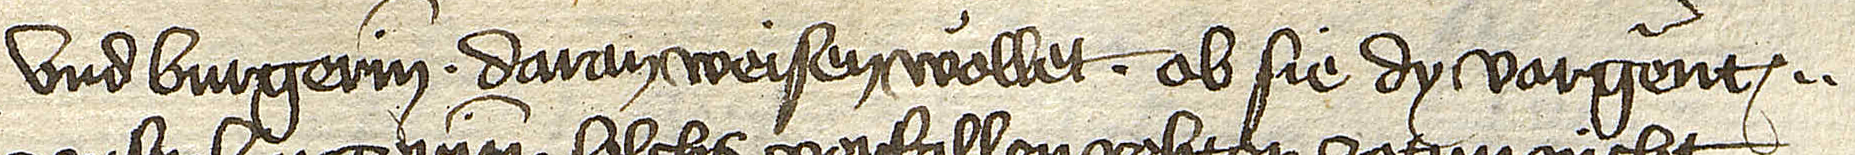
vnd burgerin* . daran weiſen wöllet . ob ſie dy vorgent* ~
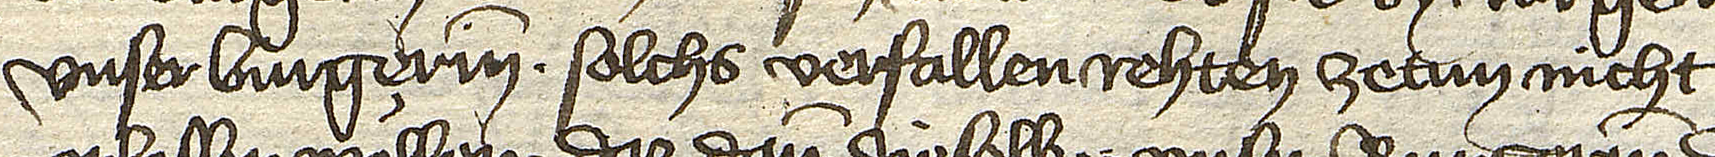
vnſer burgerin* . ſolchs verfallen rehten cʒetun nicht
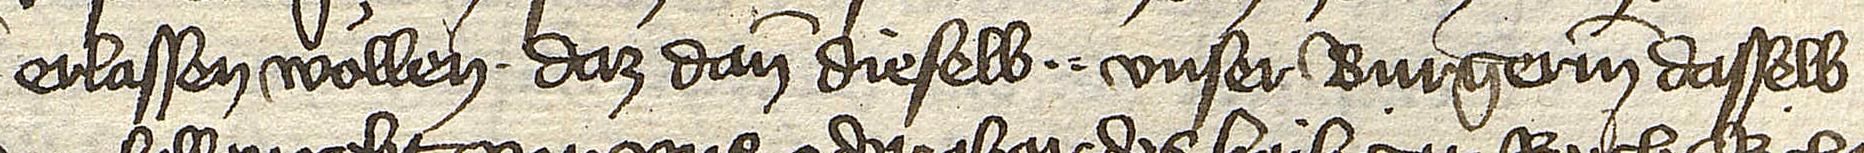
erlaſſen wöllen . daʒ dan* dieſelb ~ vnſer Burgerin* daſſelb
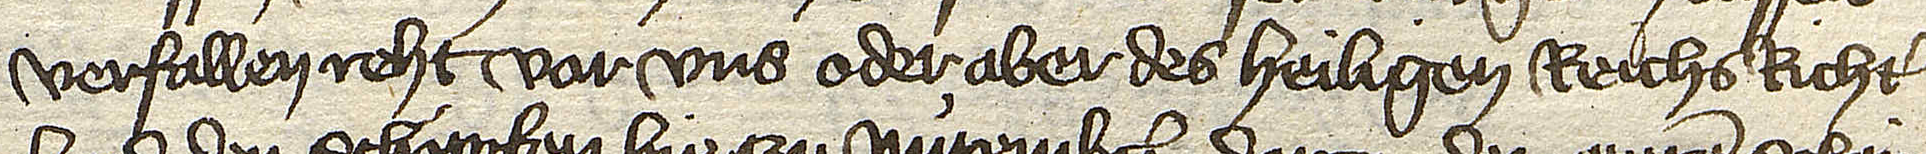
verfallen reht vor vns oder aber des heiligen Reichs Richt*
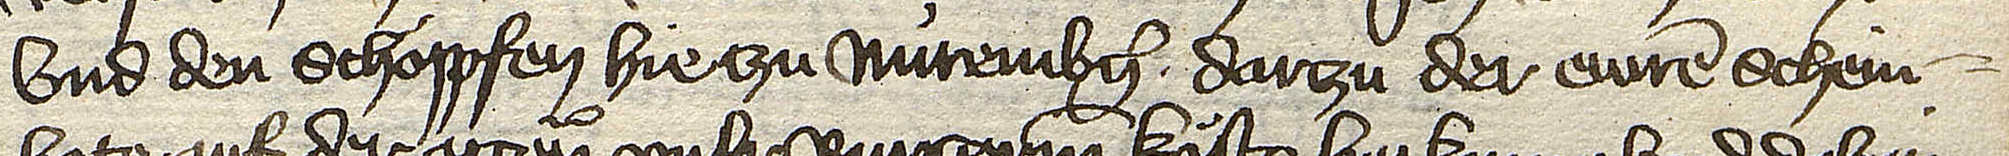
vnd den Schöppfen hie cʒu Nüremb*g . darcʒu der ewre* Schein =
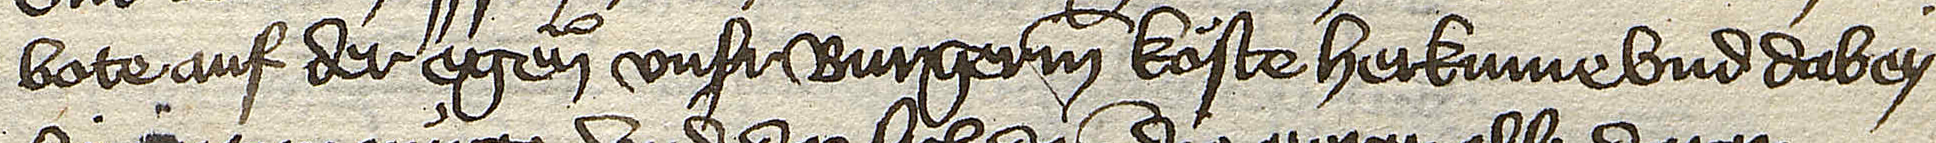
bote auf der egen* vnſ*r Burgerin* köſte herkume vnd dabey
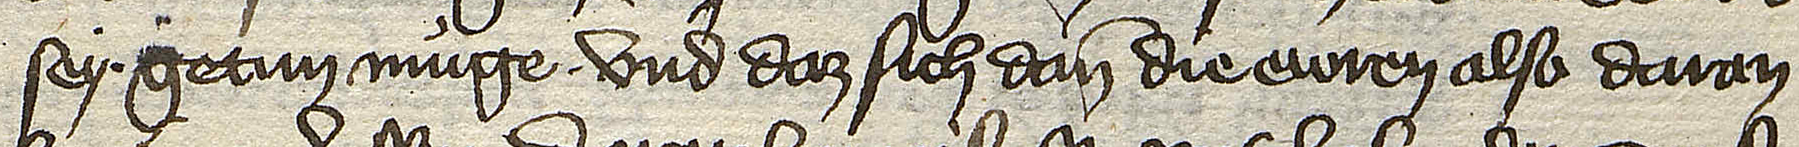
ſey . getun müge . vnd daʒ ſich dan* die ewren alſo daran
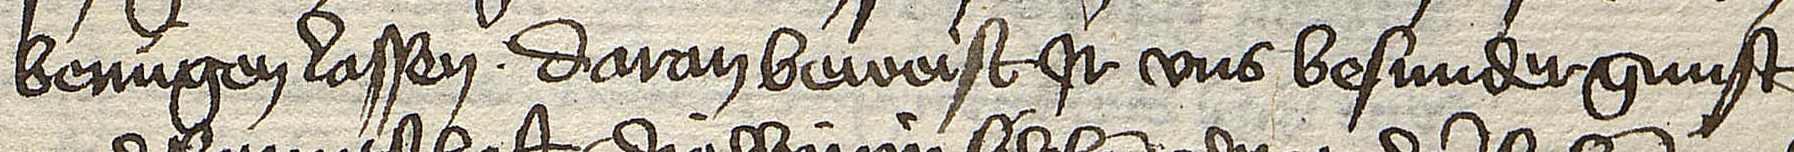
benügen laſſen . Daran beweiſt Ir vns beſunder gunſt
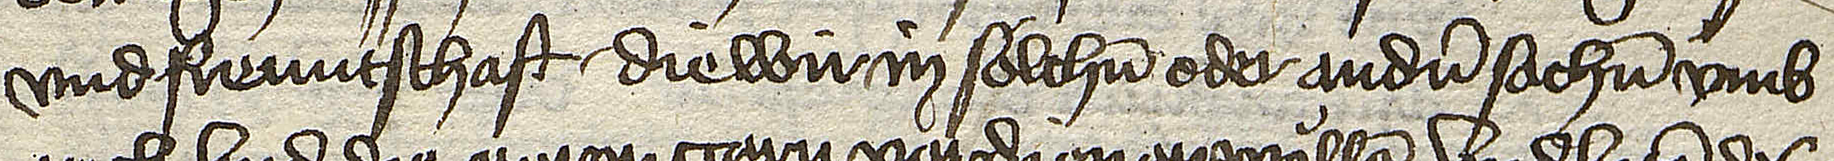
vnd freuntſchaft / die wir in ſölchn* oder andn* ſachn* v̈mb
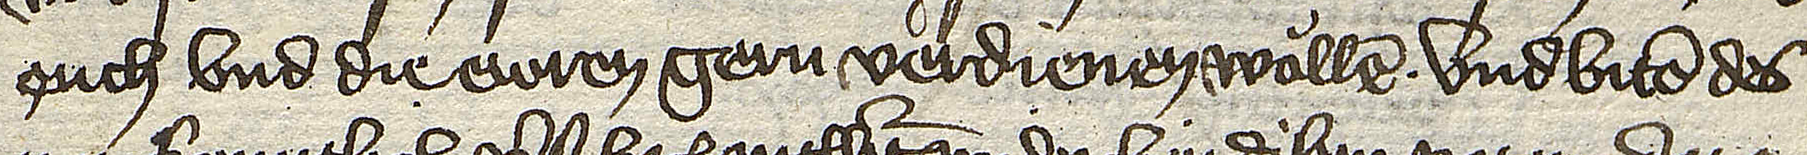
euch vnd die ewren gern verdienen wölle* . vnd bite* des
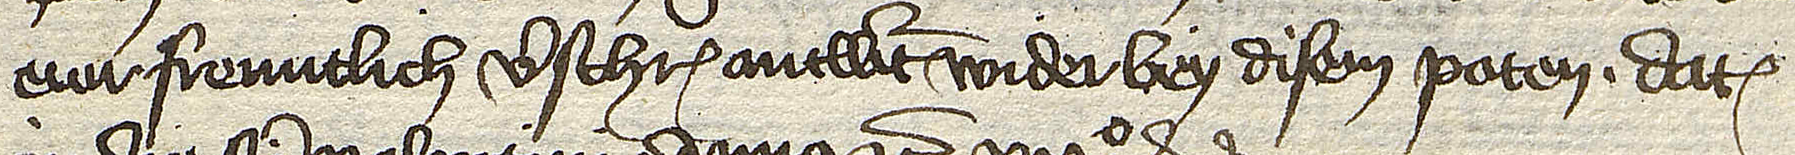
ewr freuntlich v*ſchr* antw*t wider bey diſem poten . dat*
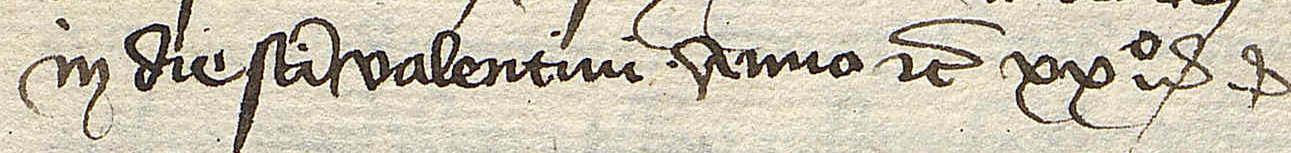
in die ſci* valentini . Anno ec* xx* § §
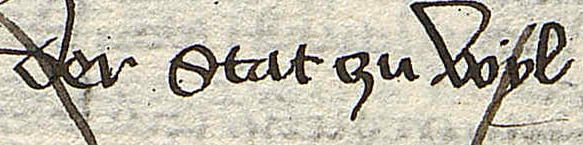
Der Stat cʒu Wyl
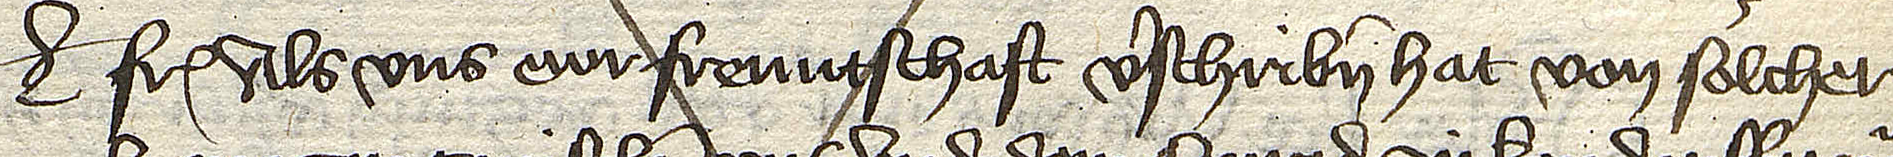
L* fr* Als vns ewr freuntſchaft v*ſchribn* hat von ſölcher
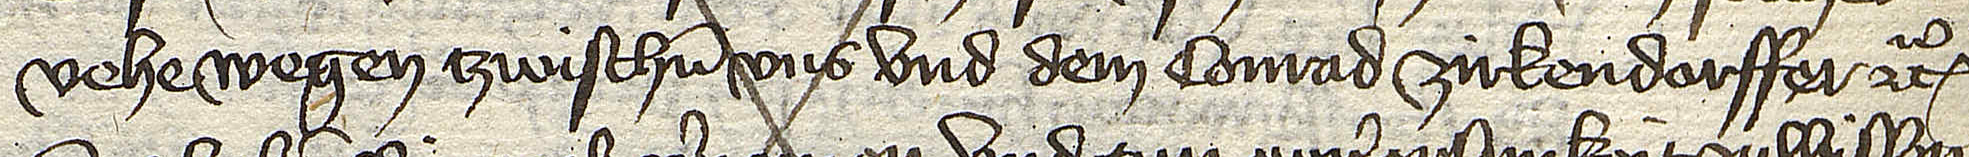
vehe wegen cʒwiſchn* vns vnd dem Conrad cʒirkendorffer ec*
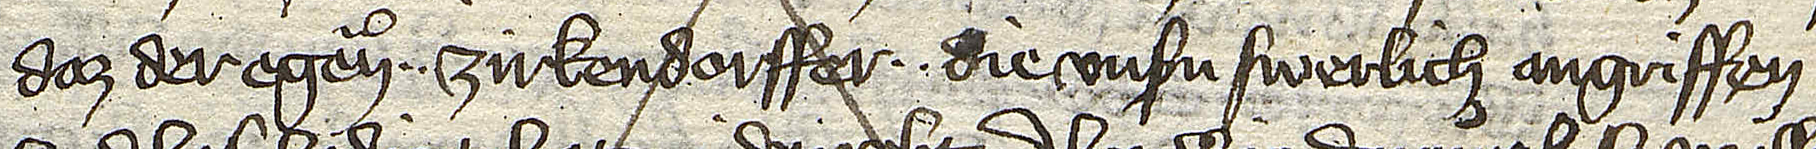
daʒ der egen* ~ cʒirkendorffer ~ die vnſ*n ſwerlich angriffen
